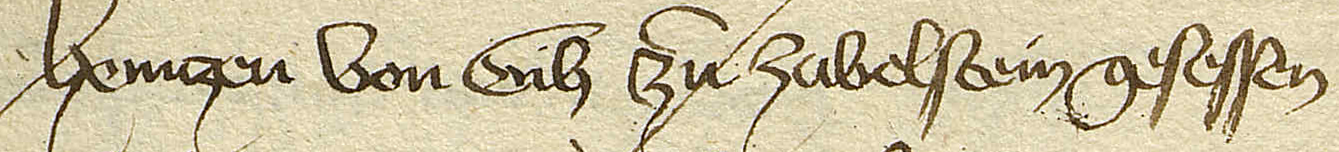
Heincʒen von Gih cʒu* CƷabelſtein geſeſſen
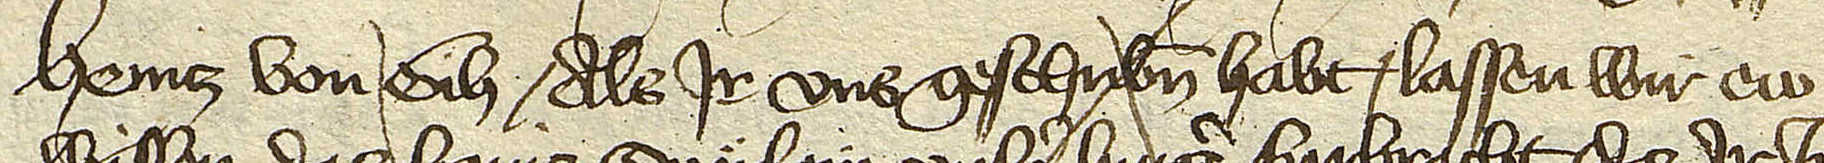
Heincʒ von Gih / Als Ir vns geſchribn* habt / laſſen wir ew
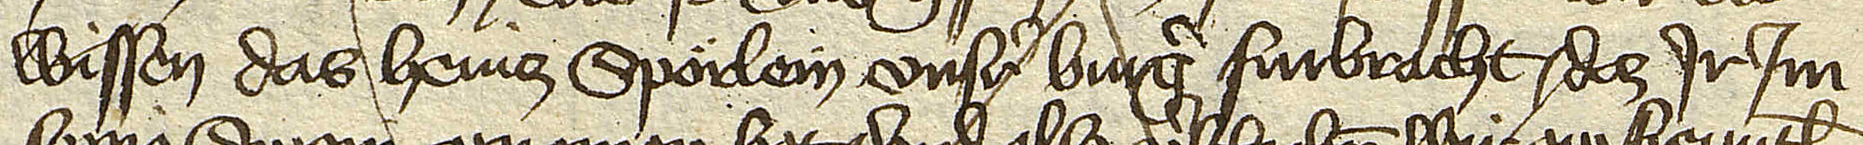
wiſſen das heincʒ Spörlein vnſr* burg* furbracht / daʒ Ir Im
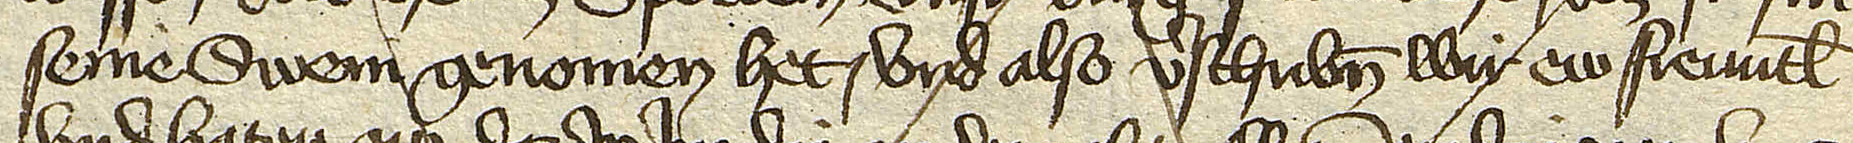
ſeine Swein genomen het / vnd alſo v*ſchribn* wir ew freuntl*
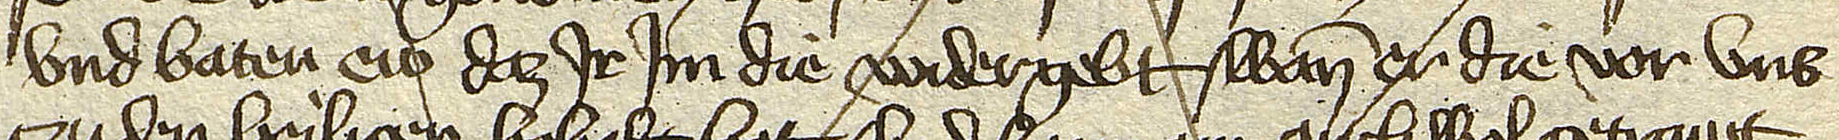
vnd baten ew daʒ Ir Im die widergebt / wan* er die vor vns
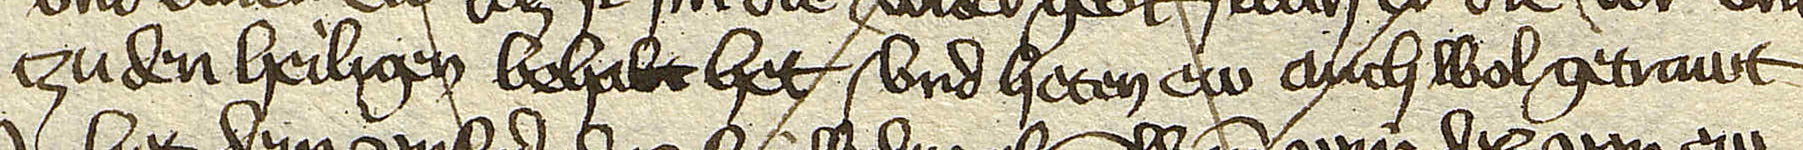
cʒu den heiligen behabt het / vnd heten ew auch wol getrawt
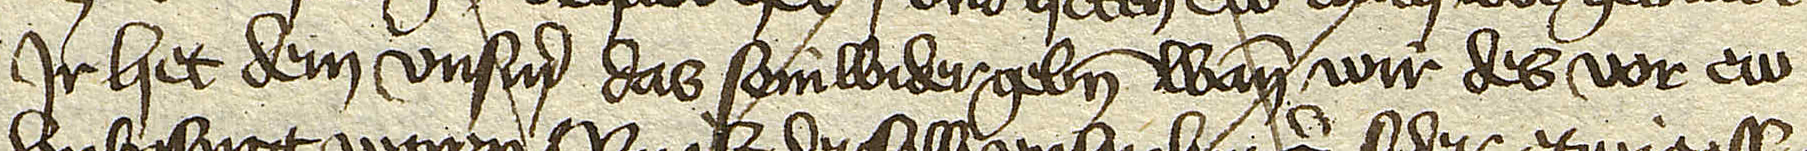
Ir het dem vnſm* das ſein wider gebn* wan* wir des vor ew
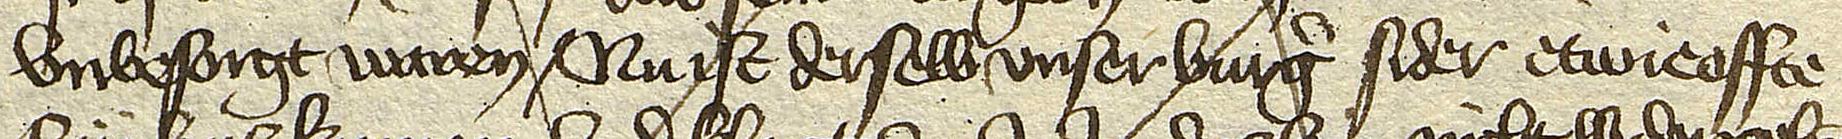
vnbeſorgt waren / Nu iſt derſelb vnſer burg* ſider etwieoffte
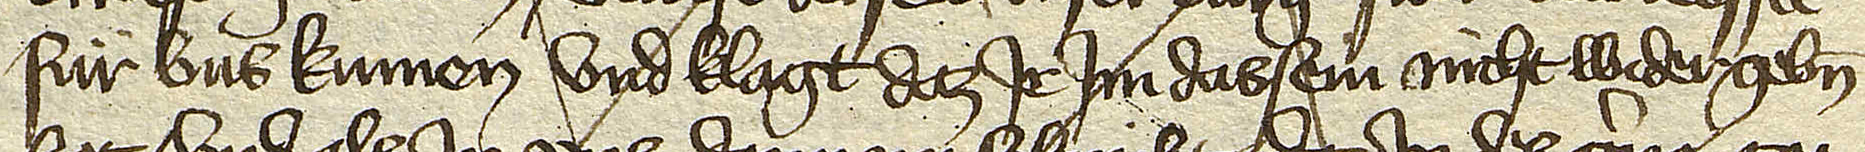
für vns kumen vnd klagt daʒ Ir Im das ſein nicht widergebn*
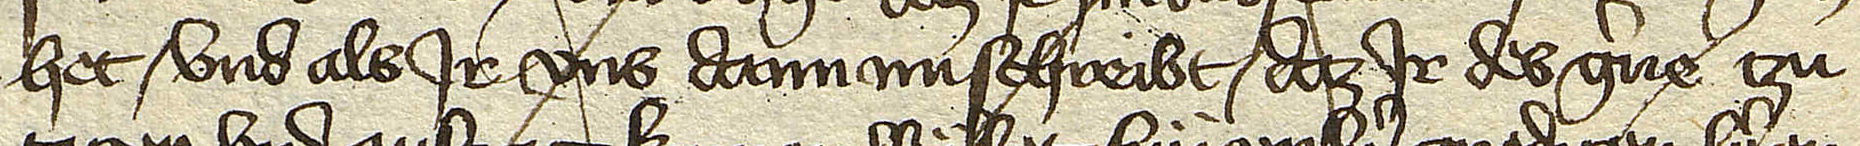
het / vnd als Ir vns dann nu ſchreibt / daʒ Ir des g*ne cʒu
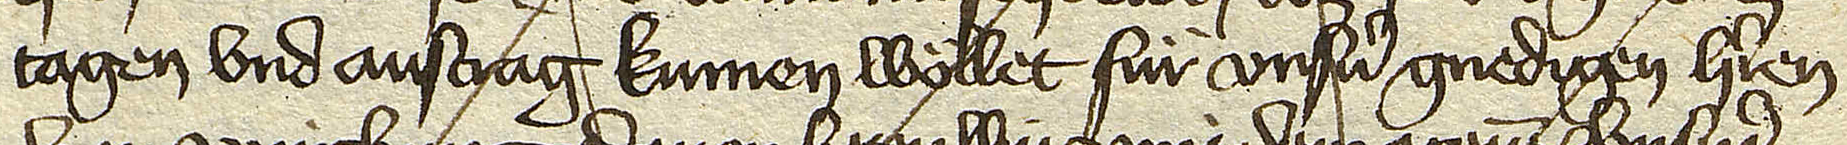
tagen vnd auſtrag kumen wöllet für vnſn* gnedigen h*ren
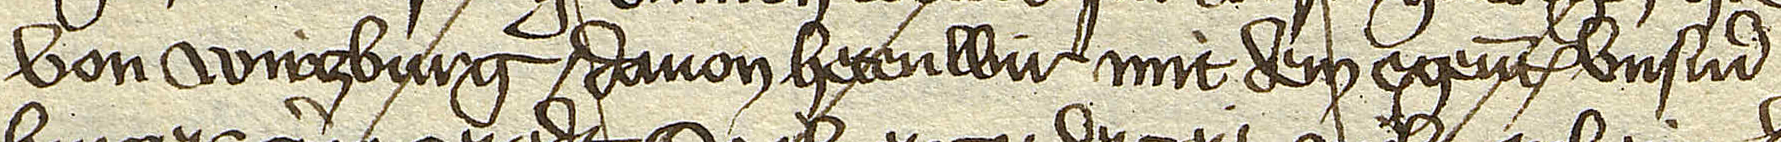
von wircʒburg / dauon heten wir mit dem egent* vnſm*
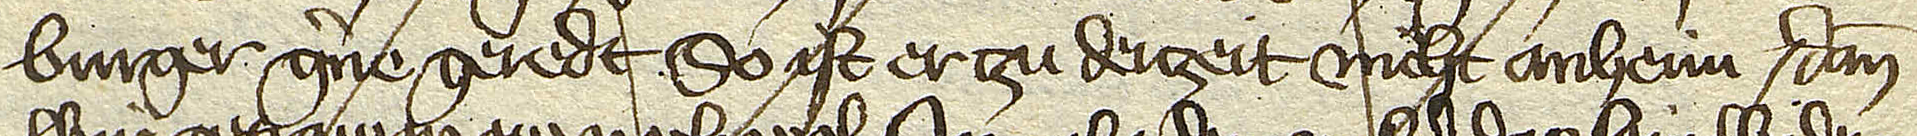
burger g*ne geredt So iſt er cʒu dercʒeit nicht anheim / dan*
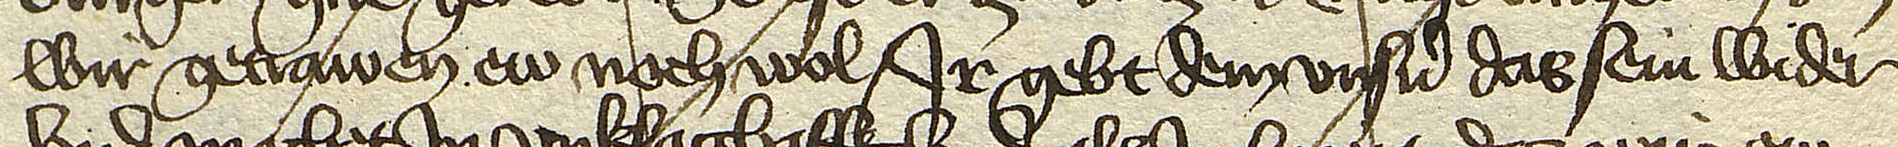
wir getrawen ew noch wol / Ir gebt dem vnſn* das ſein wider
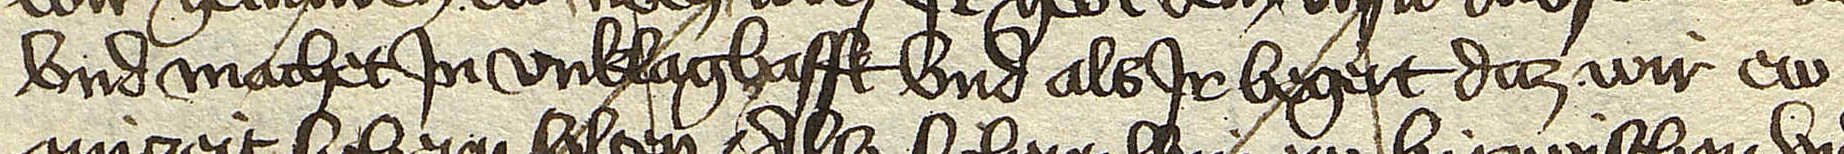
vnd machet In vnklaghafft vnd als Ir begert daʒ wir ew
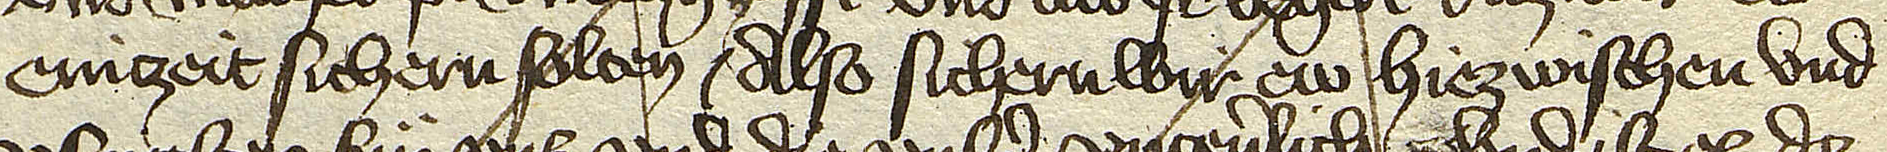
eincʒeit ſichern ſolten / Alſo ſichern wir ew hiecʒwiſchen vnd
